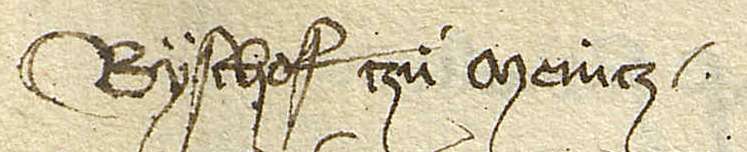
Byſchof cʒü Meincʒ / .
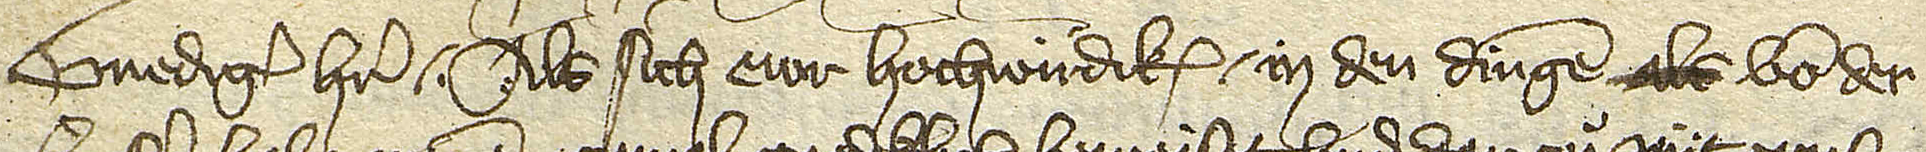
Gnedig* hr* / . Als ſich ewr hochwirdik* / in den dinge* als vo* der
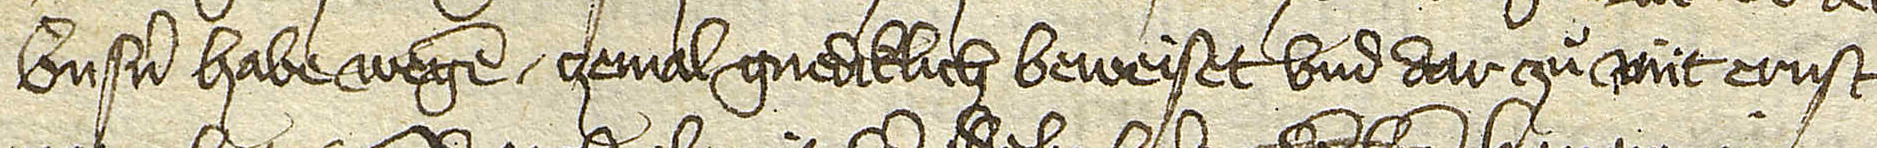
vnſn* habe wege* / cʒemal gnediklich beweiſet vnd dar cʒü mit ernſt
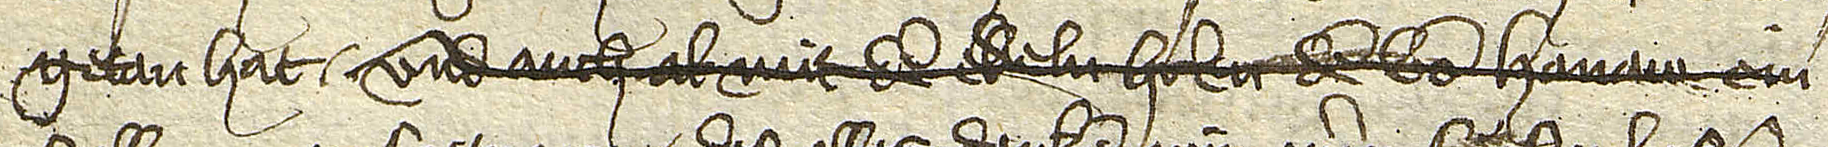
getan hat / vnd auch al mit d* edeln hr*en d* vo* hanaw ein
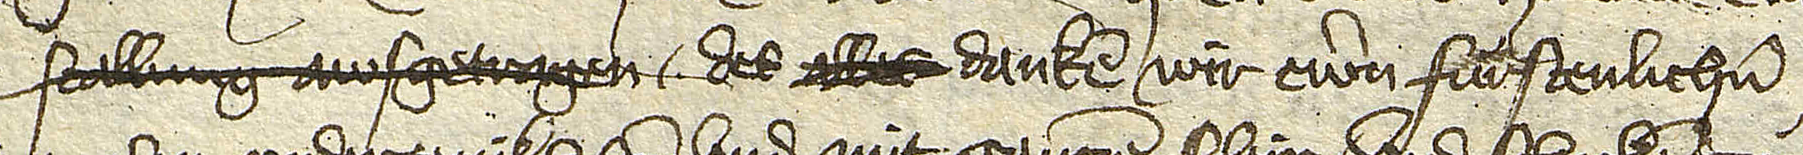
ſtallung awſgetragen / des alles danke* wir ewn* fürſtenlichn*
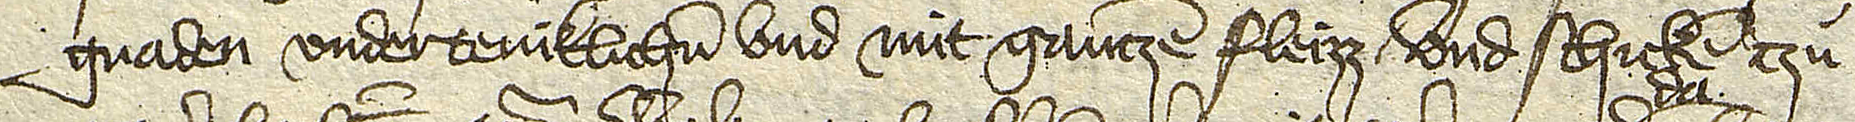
gnaden vnderteniklichn* vnd mit gancʒe* fleiʒʒ / vnd ſchicke* cʒü
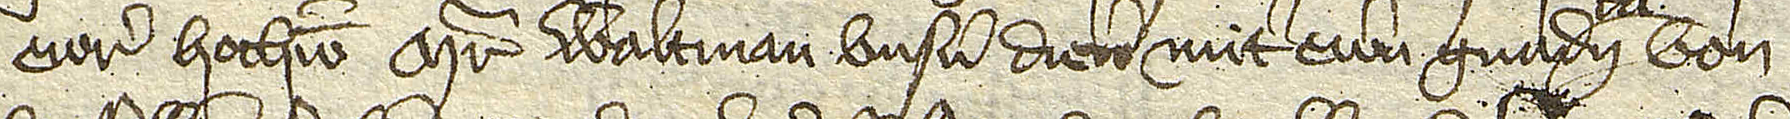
ewr* hochw* Mr* Waltman vnſn* dien* mit ewn* gnadn* von
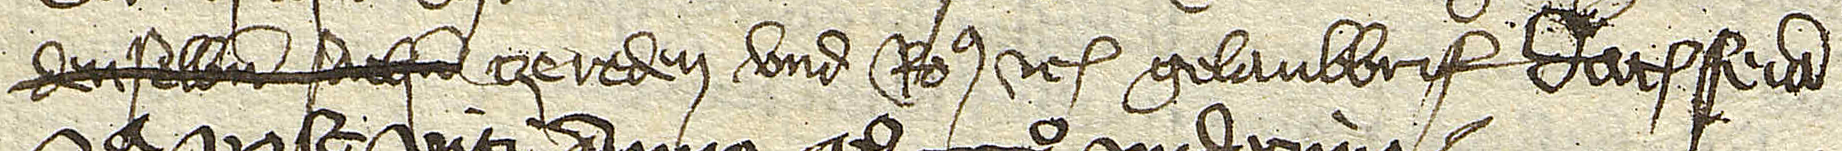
denſelbn* ſachn* cʒe reden / vnd Ro* ec* gelaubbrif dat* feia*
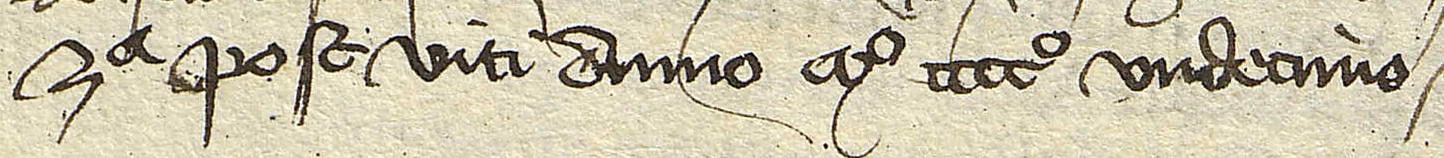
ʒ* poſt viti Anno M*cccc* vndecimo /
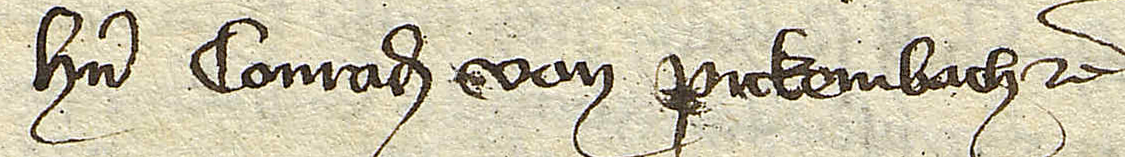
hn* Conrad von Pickembach ec*
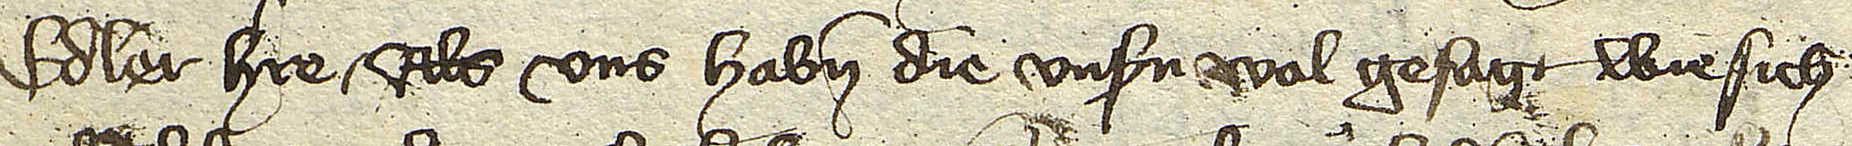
Edler h*re / Als vns habn* die vnſ*n wol geſagt wie ſich
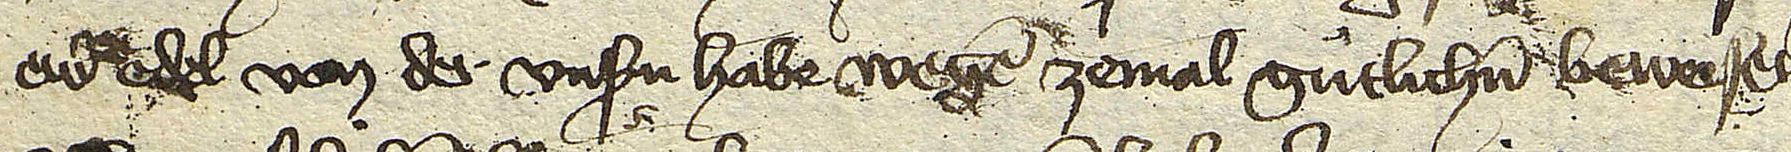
ew* edel von der vnſ*n habe wege* cʒemal gütlichn* beweiſet
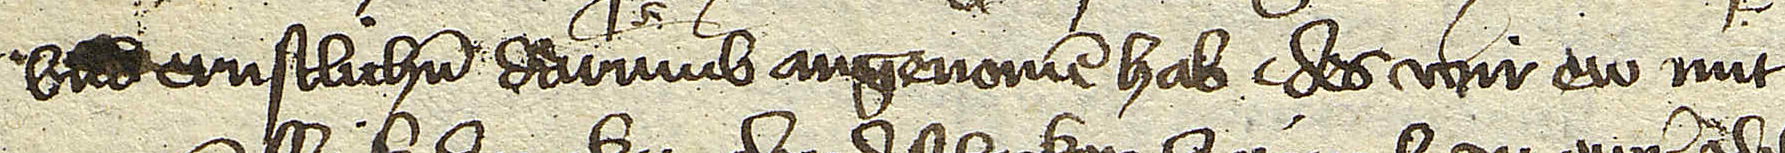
bidd ernſtlichn* darümb angenome* hab / des wir ew mit
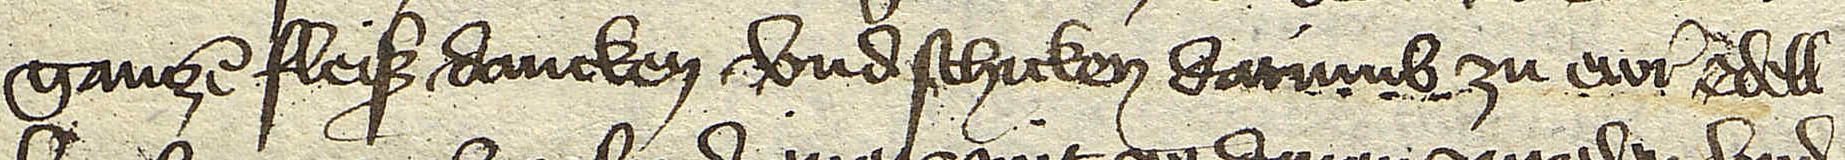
gancʒe* fleiſʒ / dancken / vnd ſchicken darümb cʒu ewr* edell
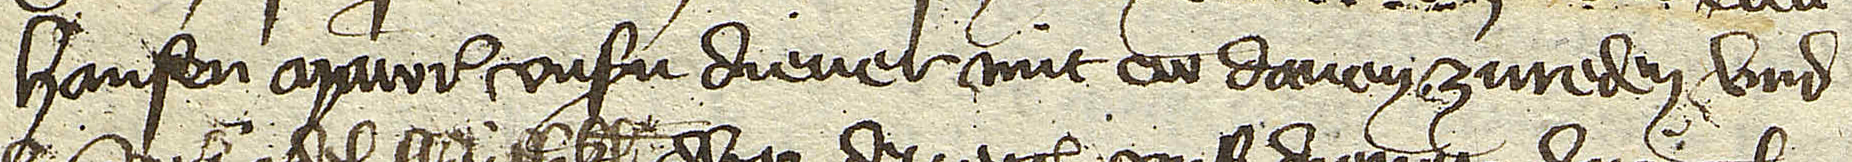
hanſen Mawr* vnſ*n diener mit ew dauon cʒureden / vnd
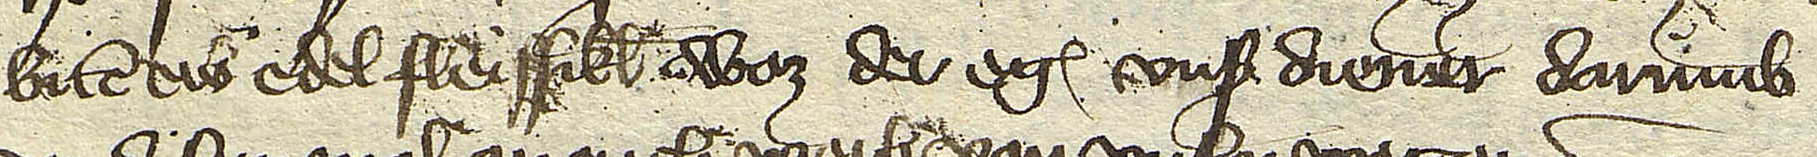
bite* ew edel fleiſſikl* / waʒ der eg* vnſ* diener darümb
